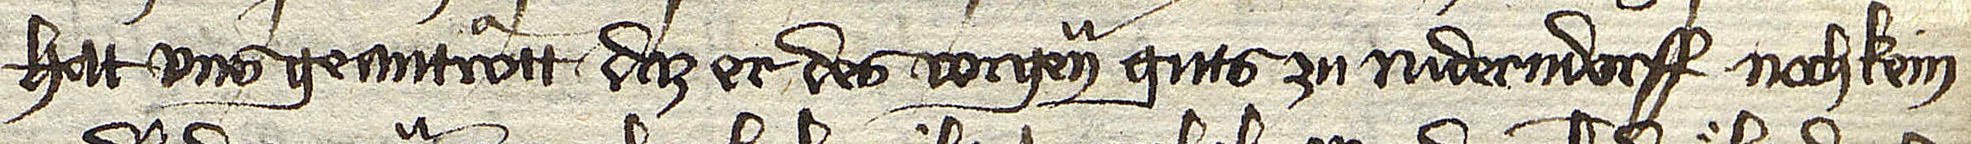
hat vns geantw*tt / Daʒ er des vorgen* guts ʒu niderndorff noch kein
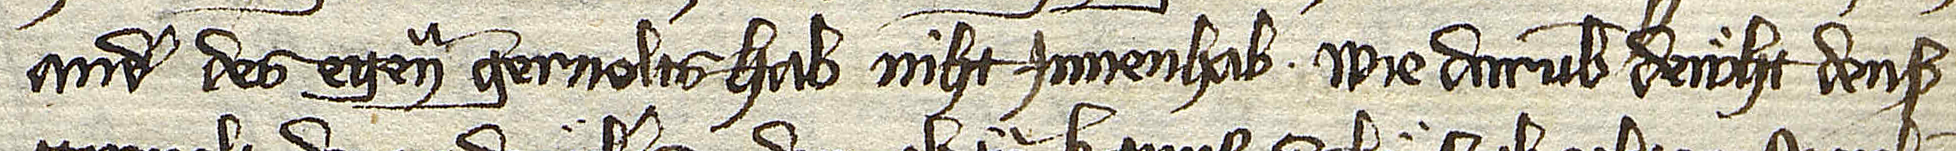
and* des egen* gernolts hab niht Innenhab . wie darub* deẅht denſ*
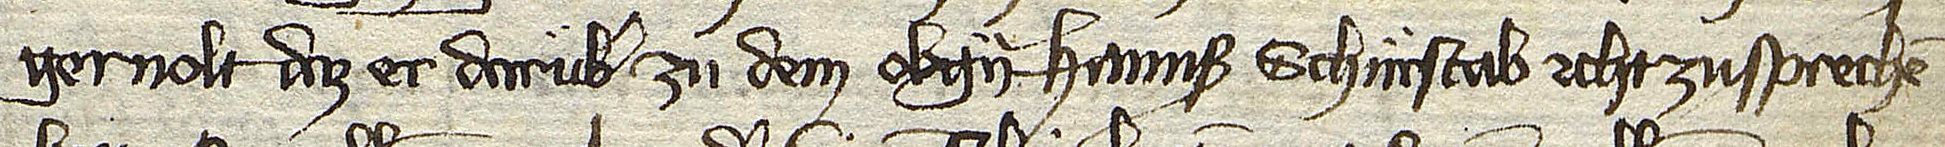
gernolt daʒ er darüb* ʒu dem obgn* hannſ* Schürſtab icht ʒu ſpreche*
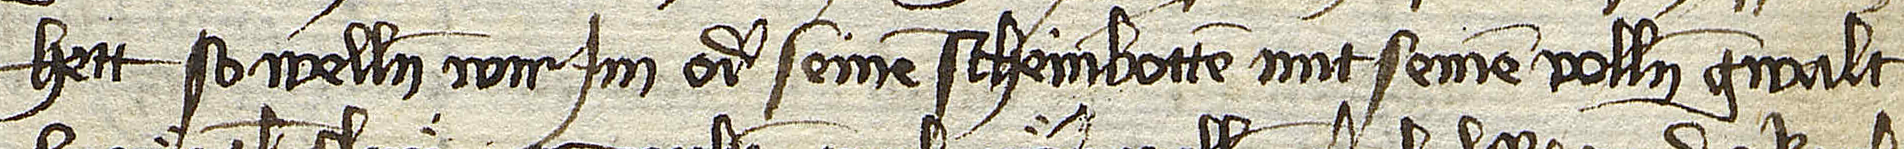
hett ſo welln* wir Im od* ſeine* ſcheinbotte* mit ſeine* volln* gwalt
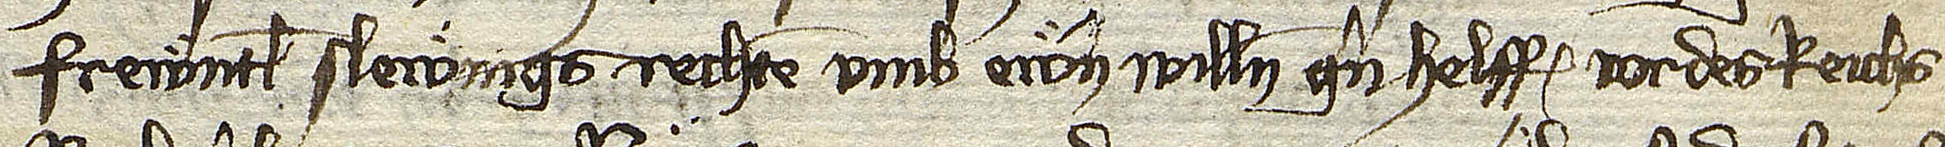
freẅntl* ſleẅnigs rechte* vmb eẅ*n willn* g*n helff* vor des Reichs
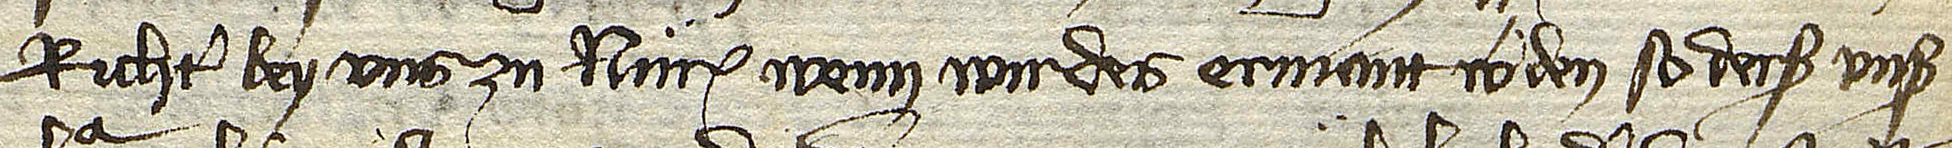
Richt* bey vns ʒu Nür* wenn wir des ermant w*den ſo derſ* vnſ*
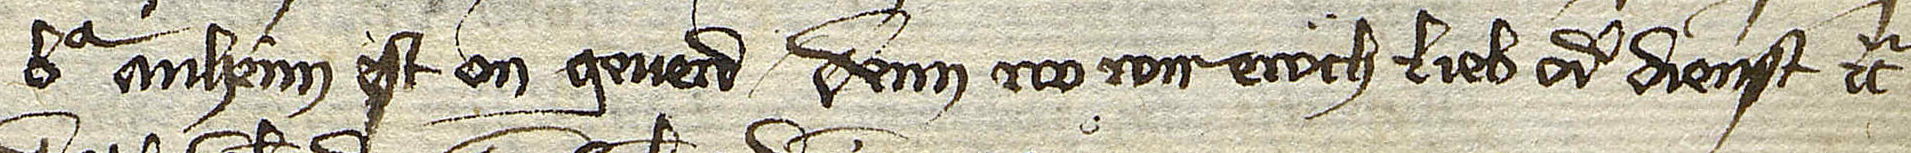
b* anheim iſt on geuerd / Denn wo wir eẅch lieb od* dienſt ec*
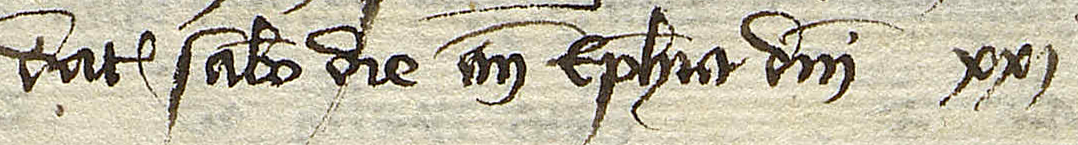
Dat* ſabo* die an* Ephia* d*ni xxi*
